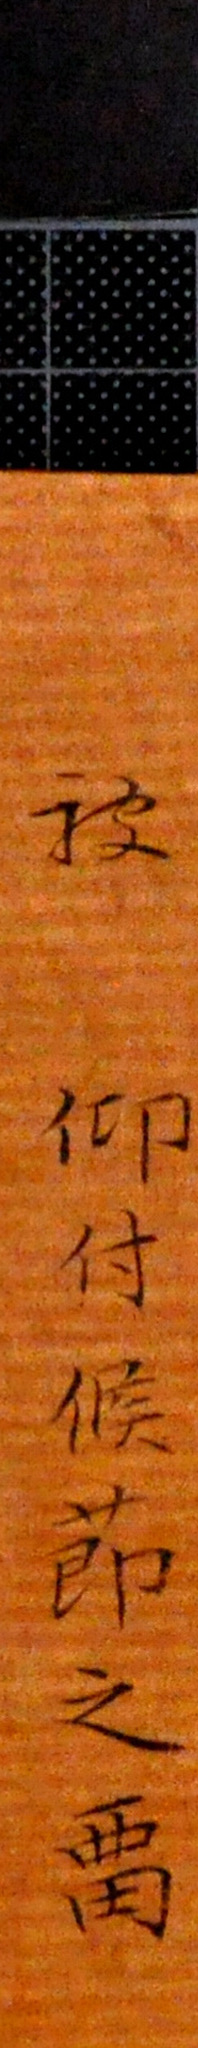被仰付候節之留
